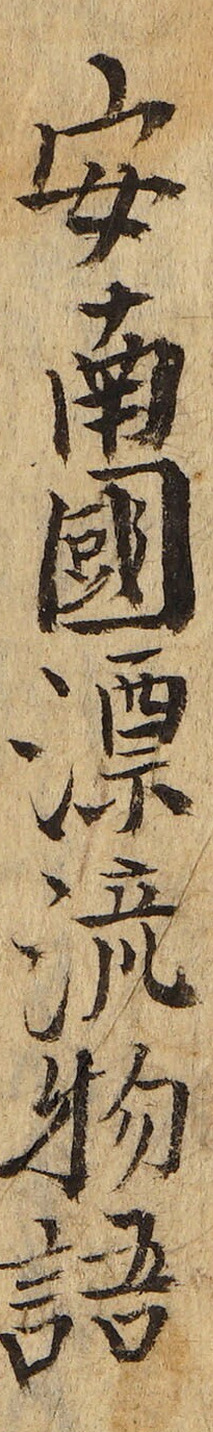安南国漂流物語
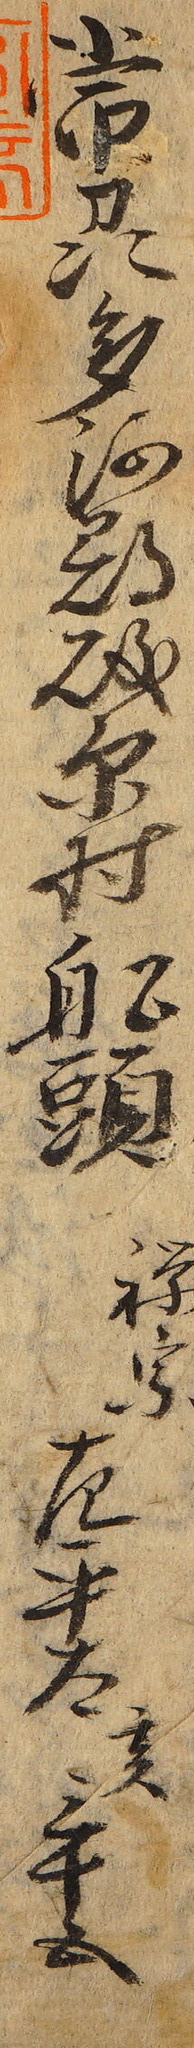常州多河郡磯原村船頭禅宗左平太亥三十五
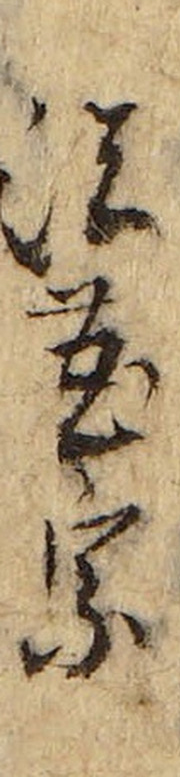法華宗
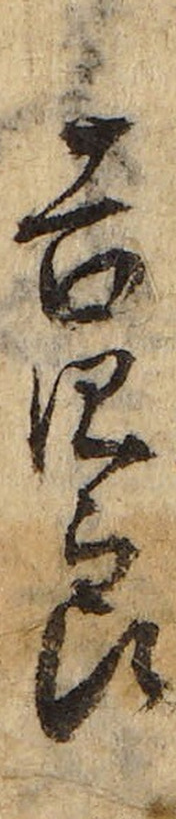吉四郎
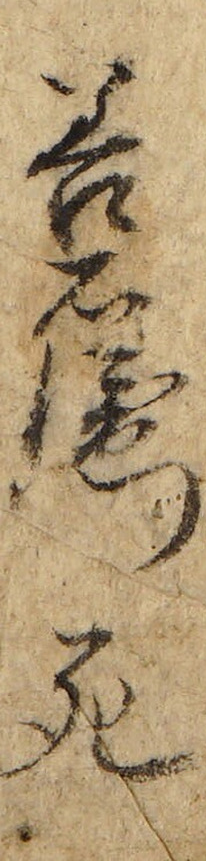善右衛門死
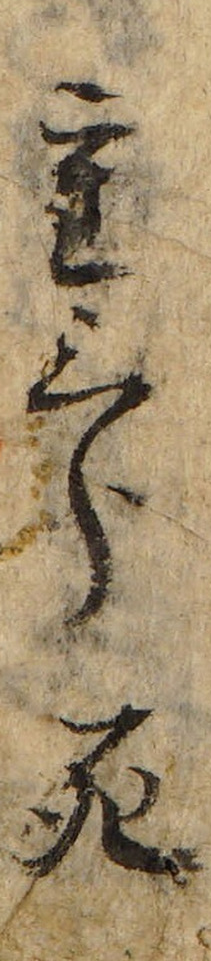重三郎死
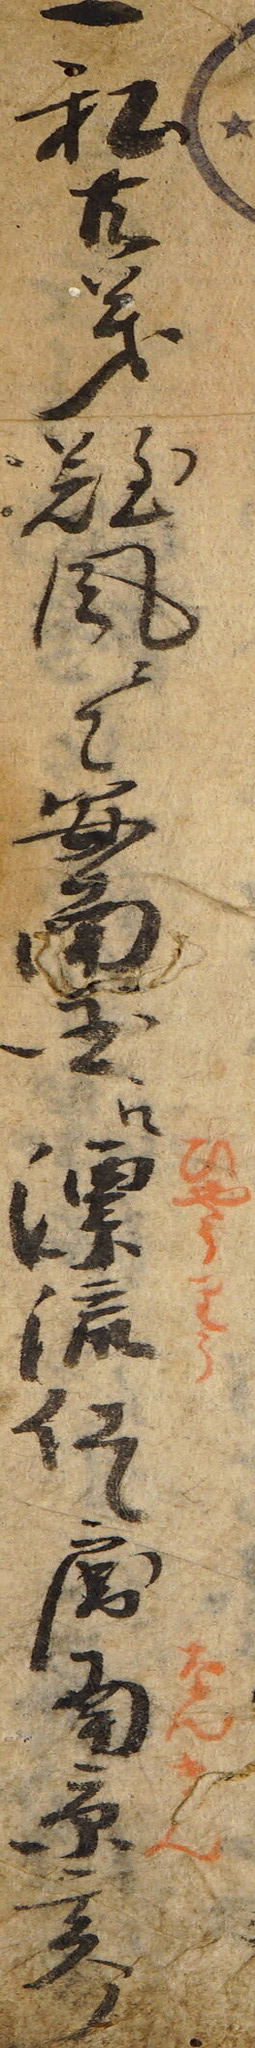一私共義難風にて安南国え漂流仕候処南京亥の
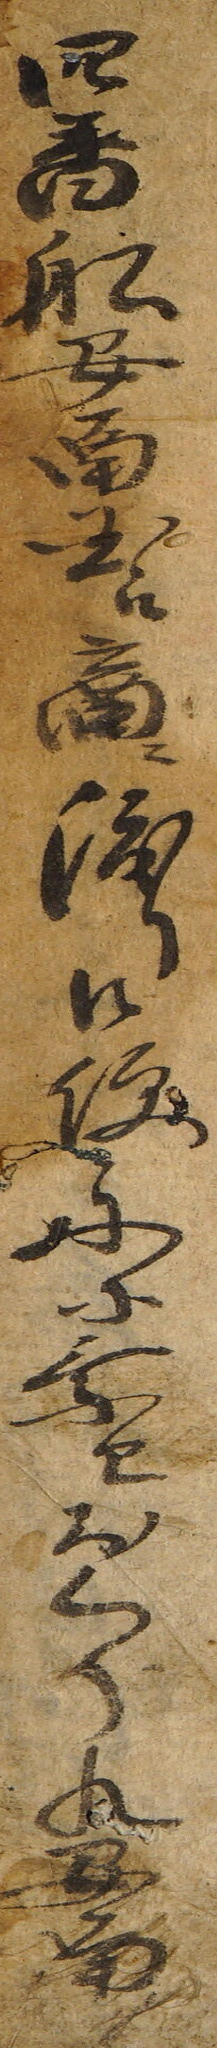四番船安南国え商に渡り候便船に乗せおくられ安南ゟ
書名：安南国漂流物語（水戸磯原村船頭）
